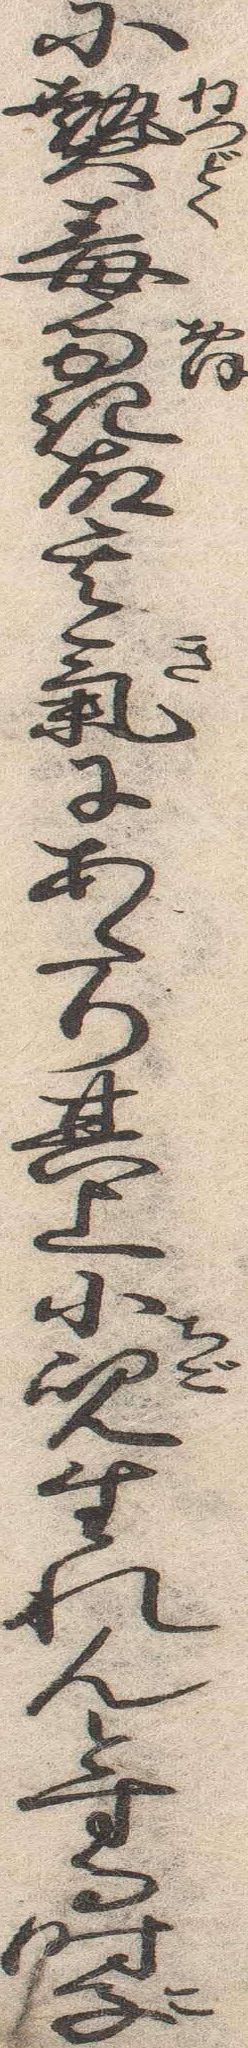に𤍽毒多き故其氣にあたり其上小児生れんとする時子
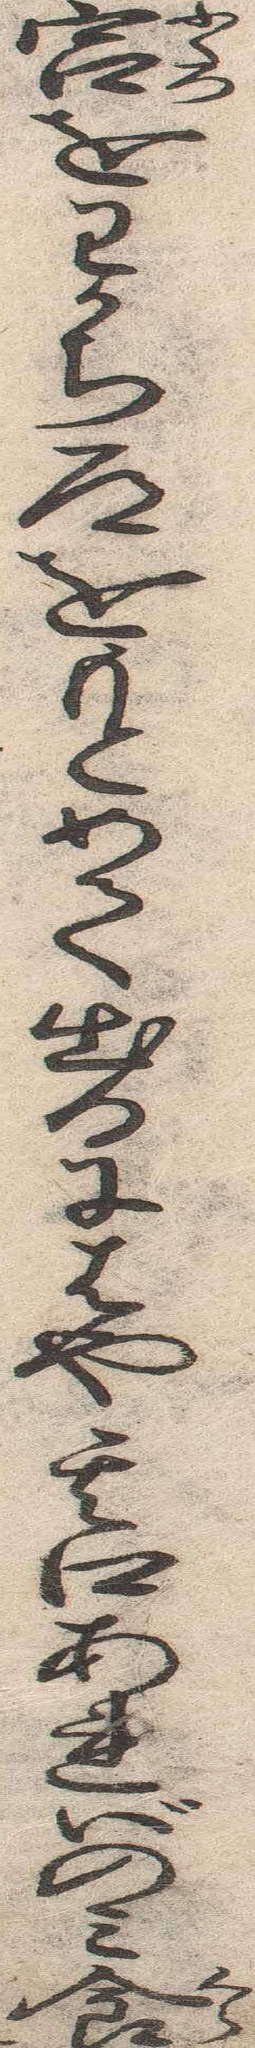宮をわかち道をもとめて出るにはや其口あればのみ食
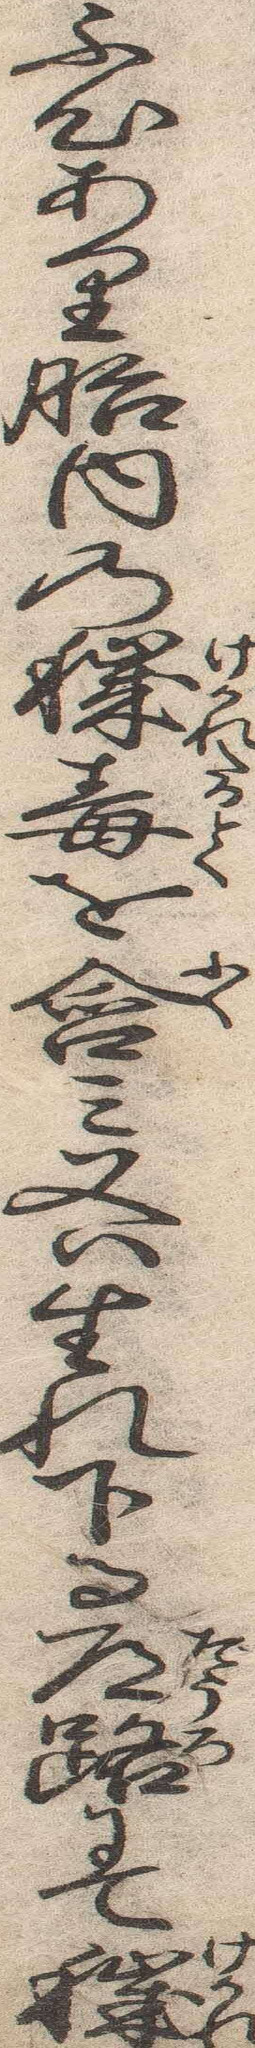ふ心あり胎内の穢毒を含み又は生れ下る道路にて穢
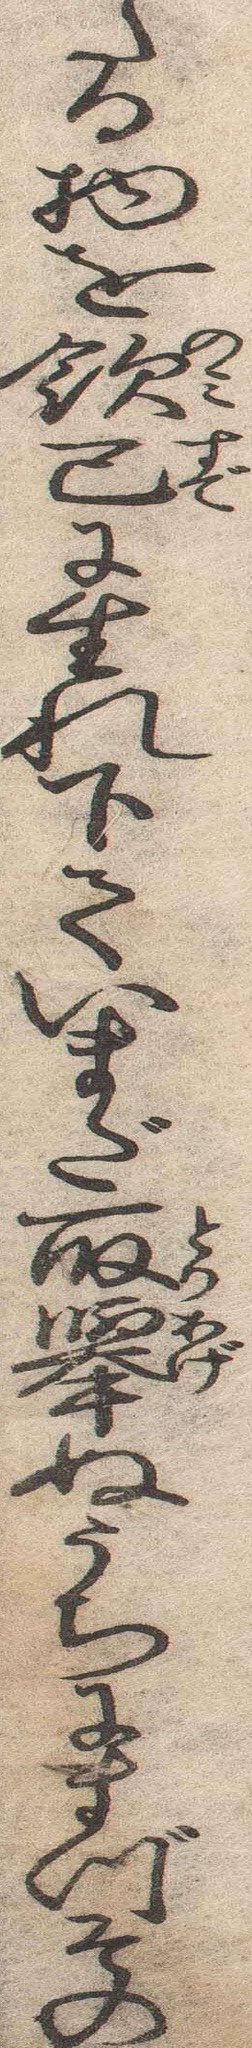たる物を飲已に生れ下ていまだ取舉ぬうちにまづその

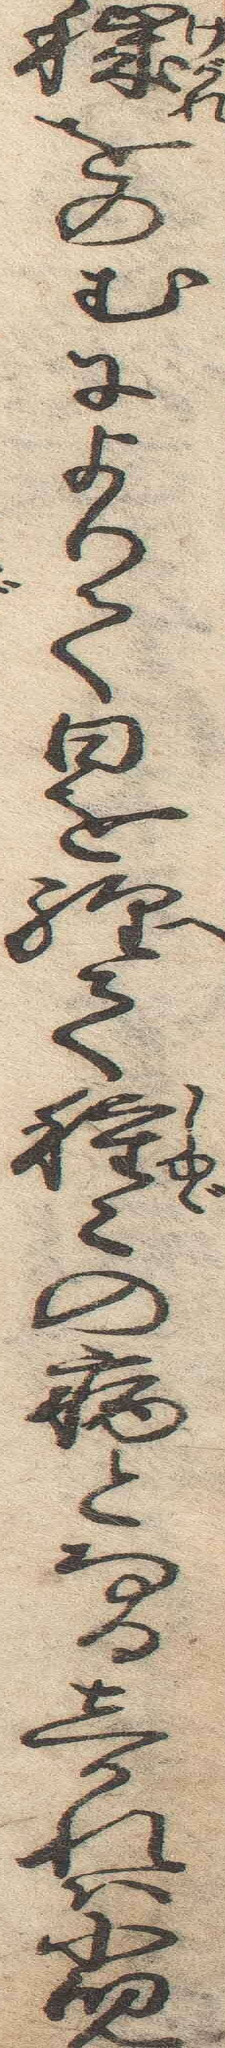穢をのむによりて日を経て種〻の病となるしかれは小児
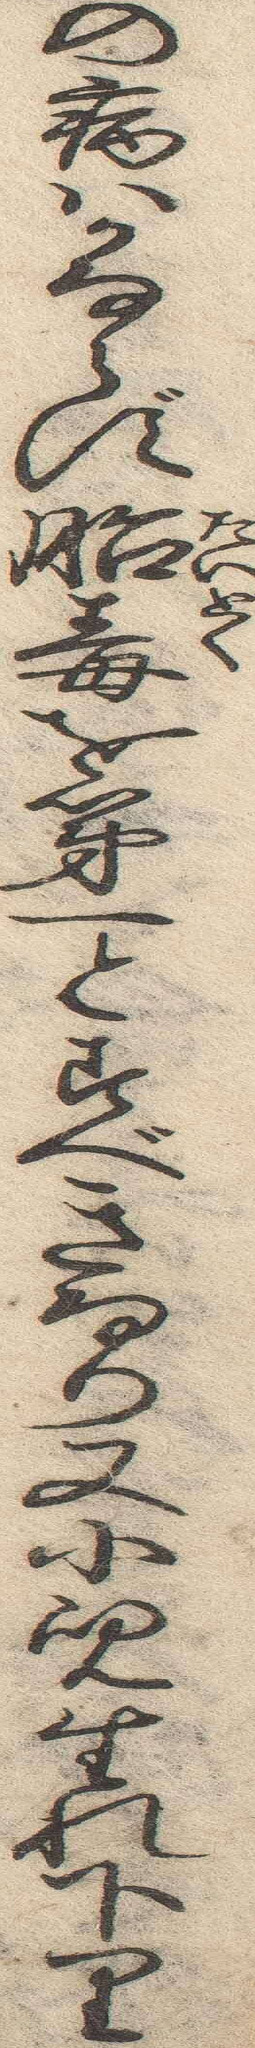の病はかならず胎毒を第一とすべきなり又小児うまれ下り
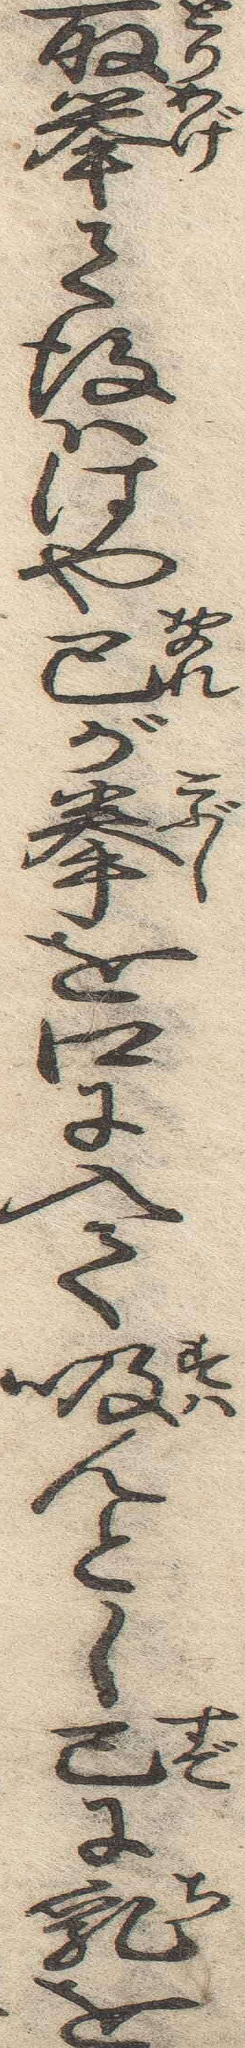取挙て後ははや己が拳を口に入て吸んとし已に乳を
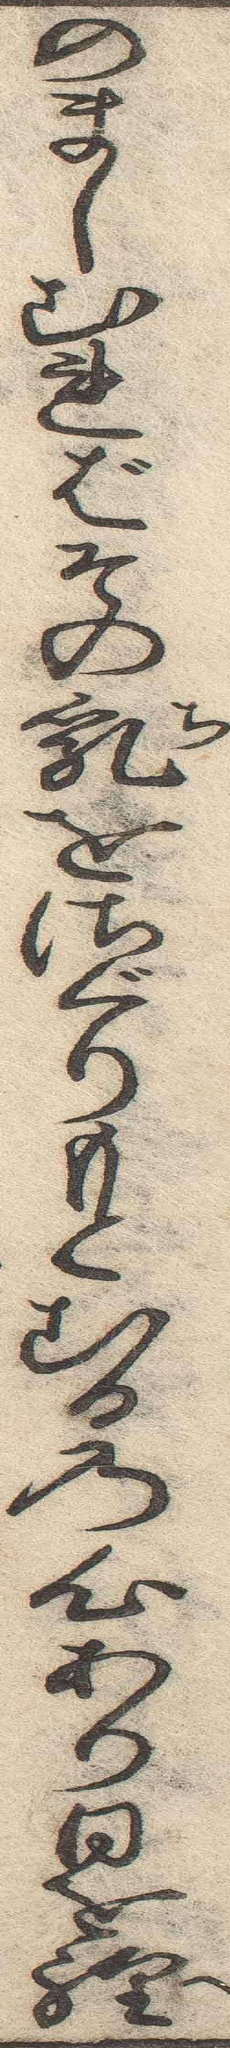のましむればその乳をさぐりもとむるの心あり日を経
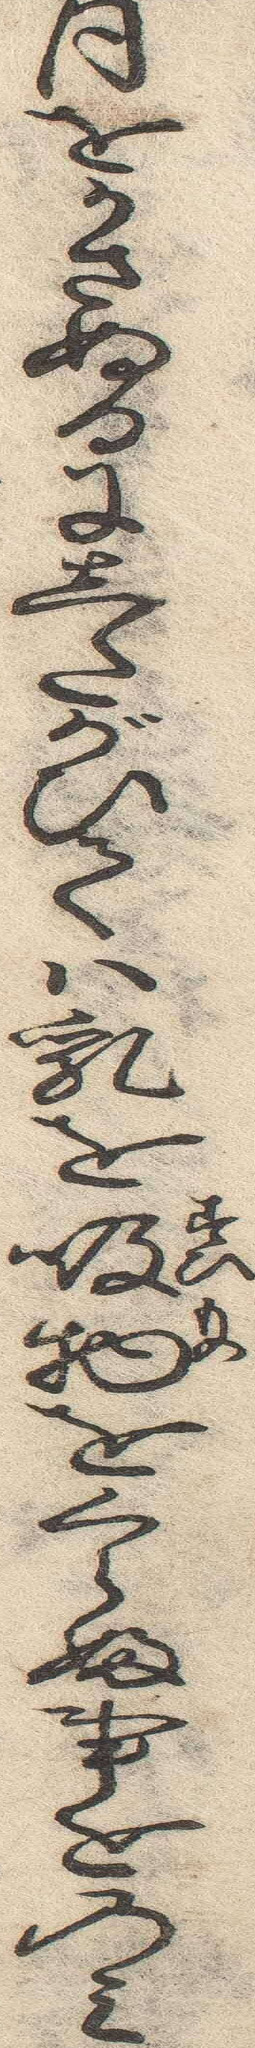月をかさぬるにしたがひては乳を吸物をくらふ事をのみ
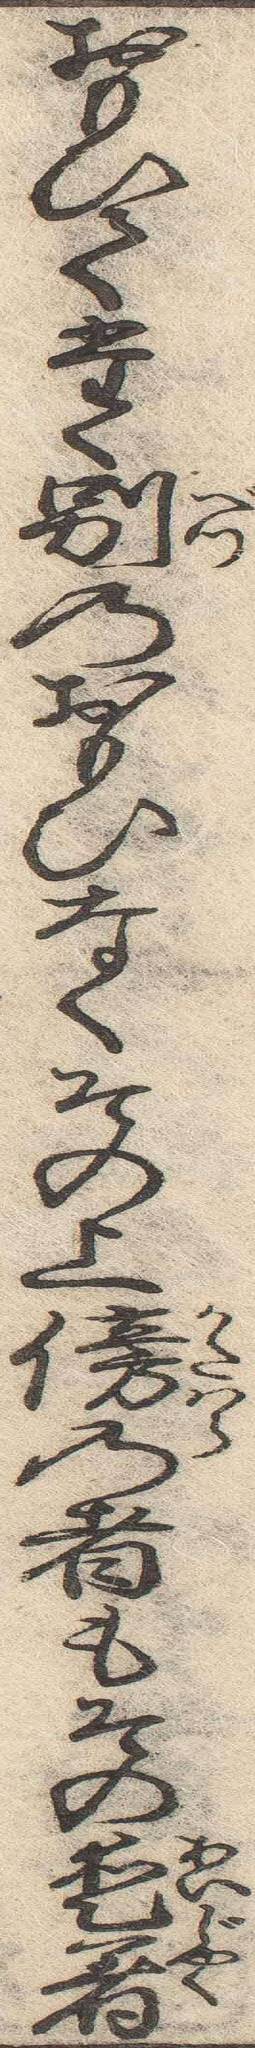おもひてたゝ別のおもひなくその上傍の者もその愛箸
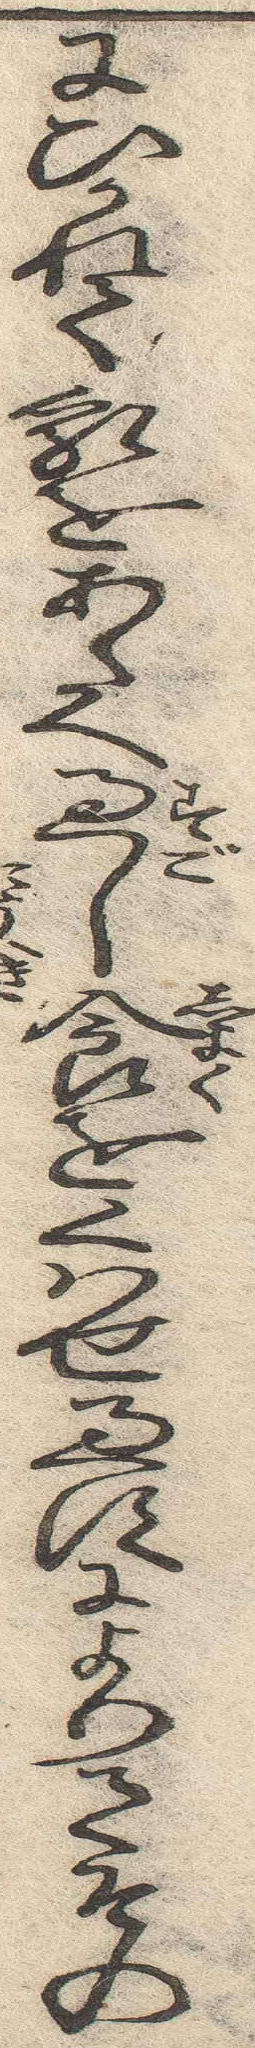にひかれて乳をあたへ過し食をくはせ過すによりてその
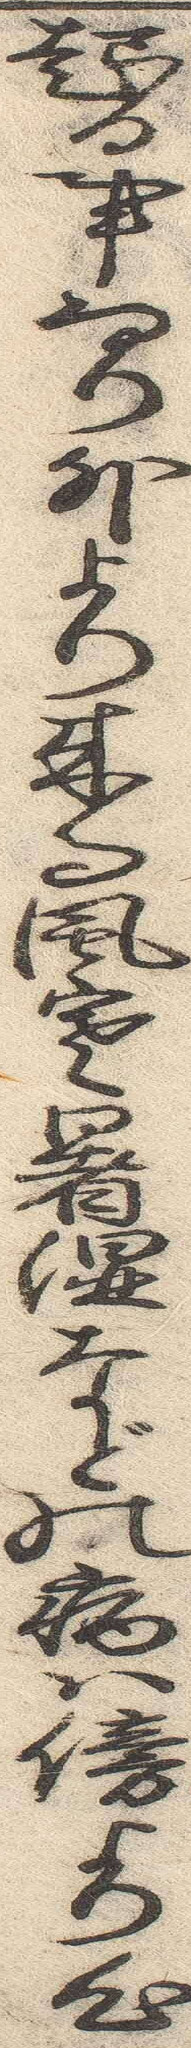起る事なり外より來る風寒暑湿などの病は傍より心
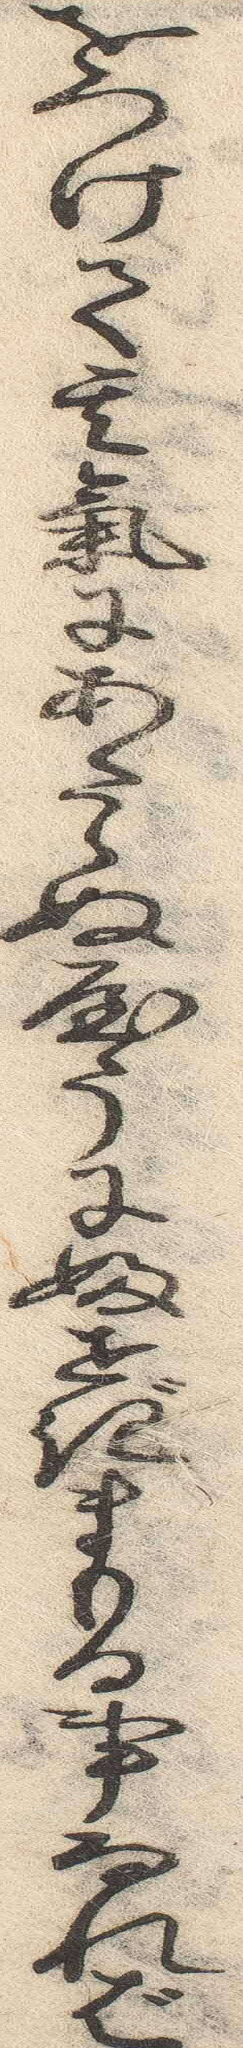をつけて其氣にあたらぬやうにふせぎまもる事なれば
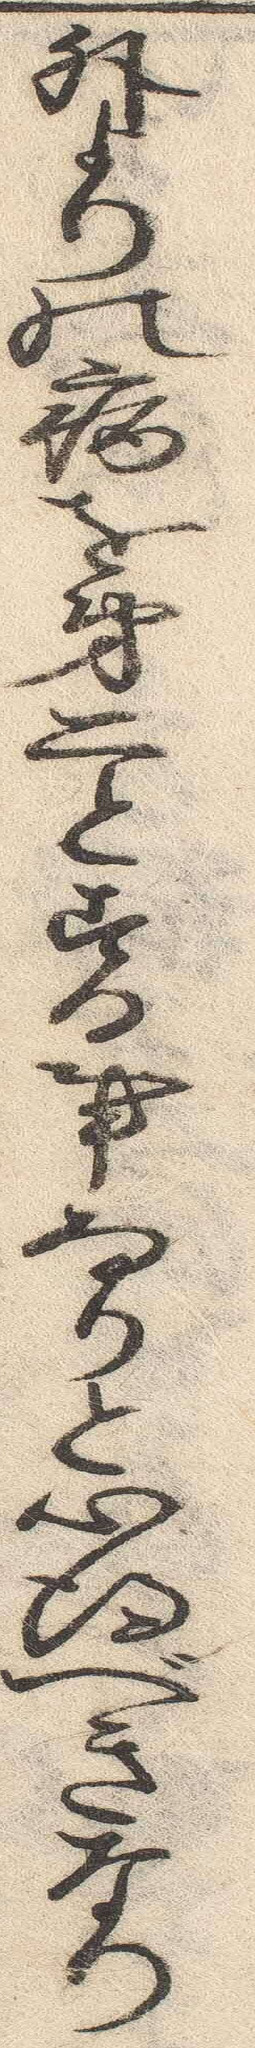外よりの病を第二とする事なりと心得べきなり
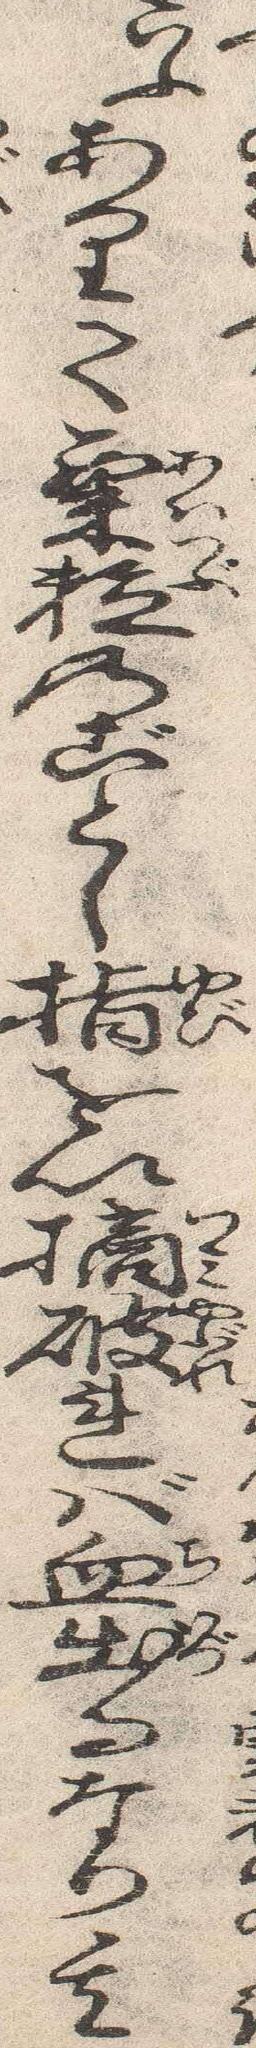をいふありて粟粒のごとし指を以摘破れば血出るなり其
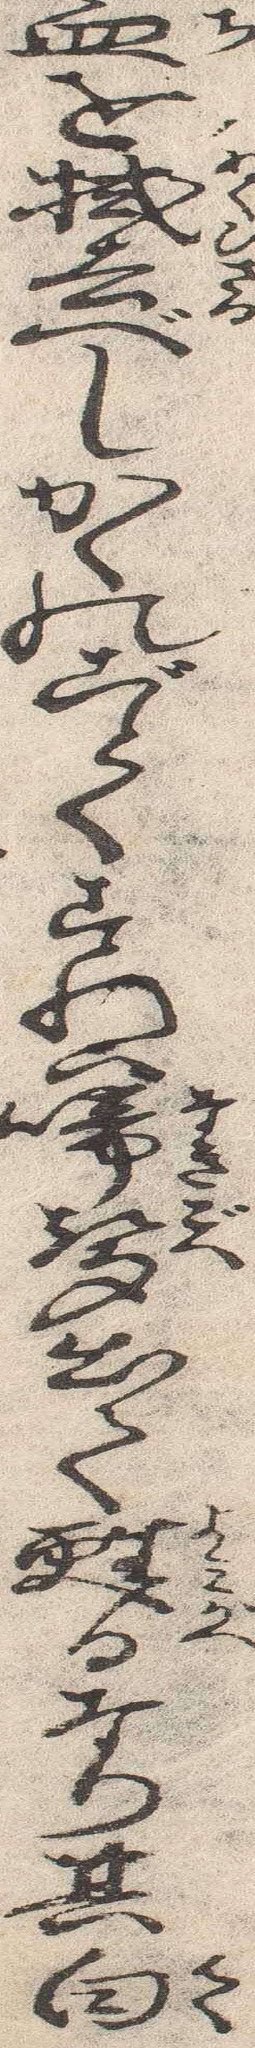血を拭去べしかくのごとくすれは啼聲出て甦るなり其白
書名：小児必用養育草
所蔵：東京学芸大学附属図書館 国文学研究資料館
